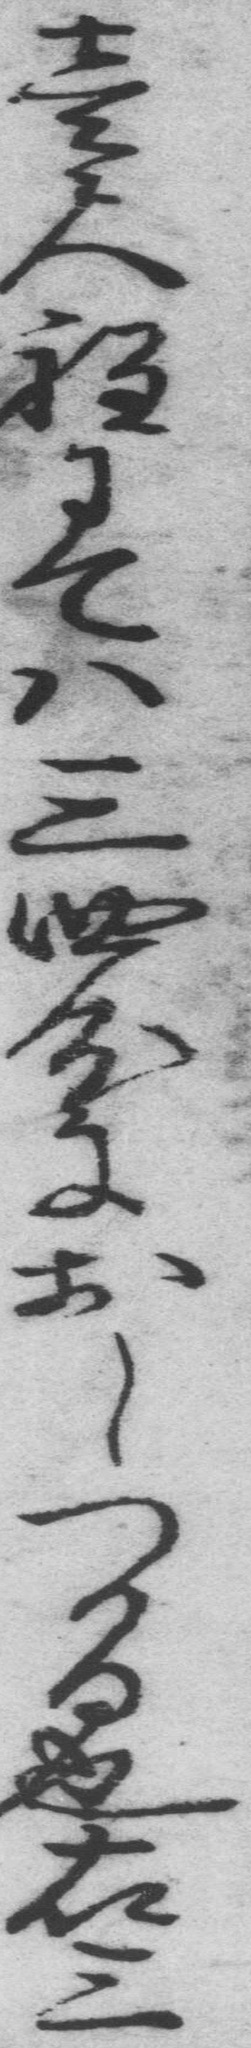壱尺程にては三四分におしつかる也右三
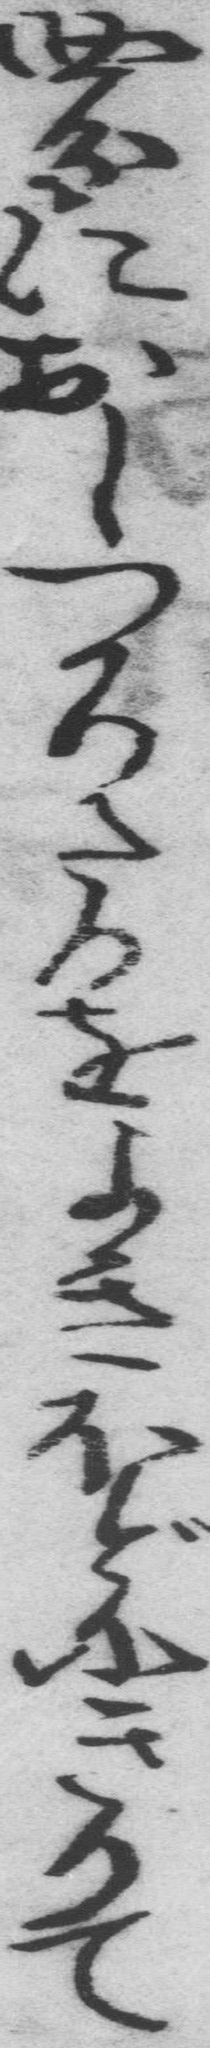四分におしつかりたるをよきほどにきりて
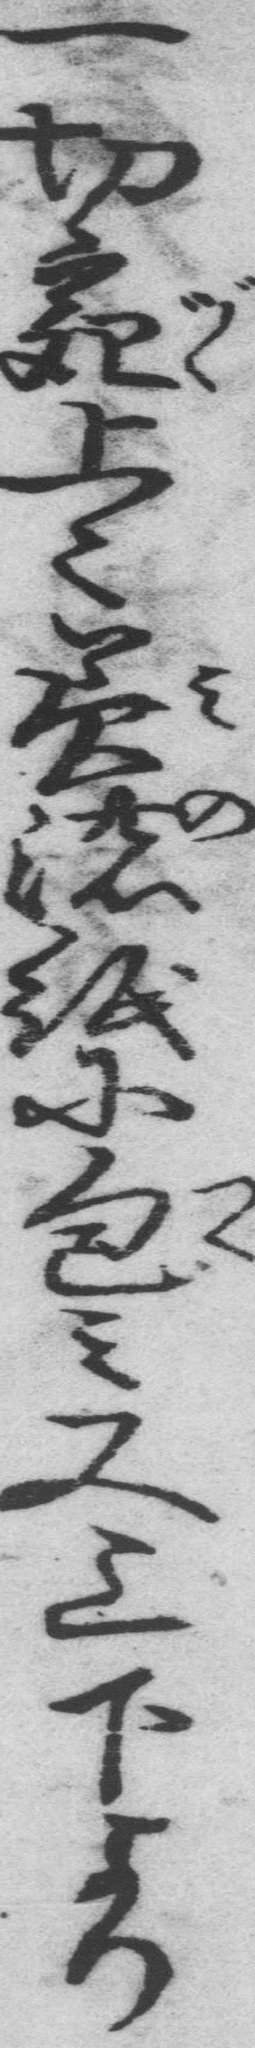一切宛上々美濃紙に包み又上下より
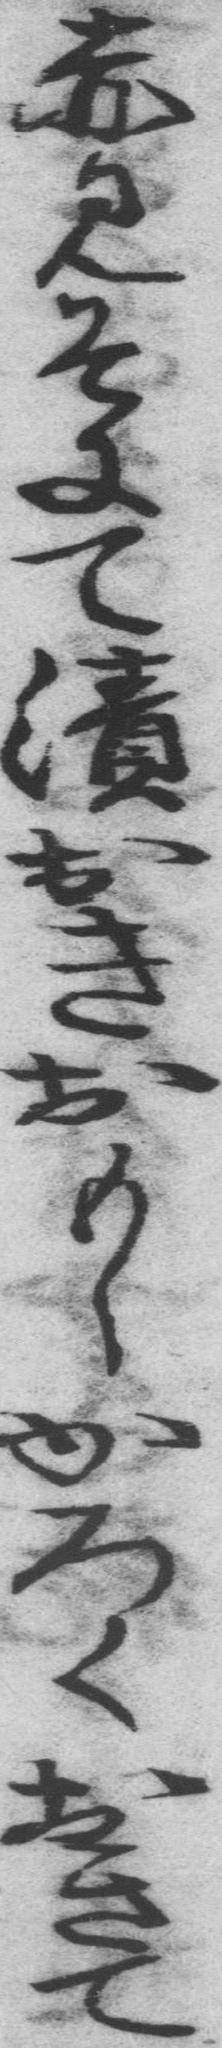赤みそにて漬おきおもしかろくおきて
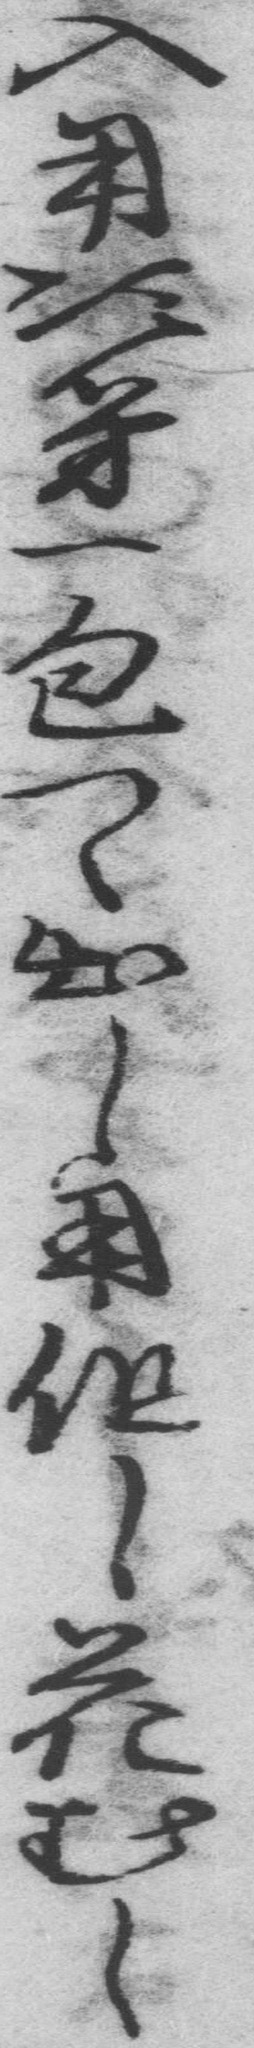入用次第一包つゝ出し用但し花むし
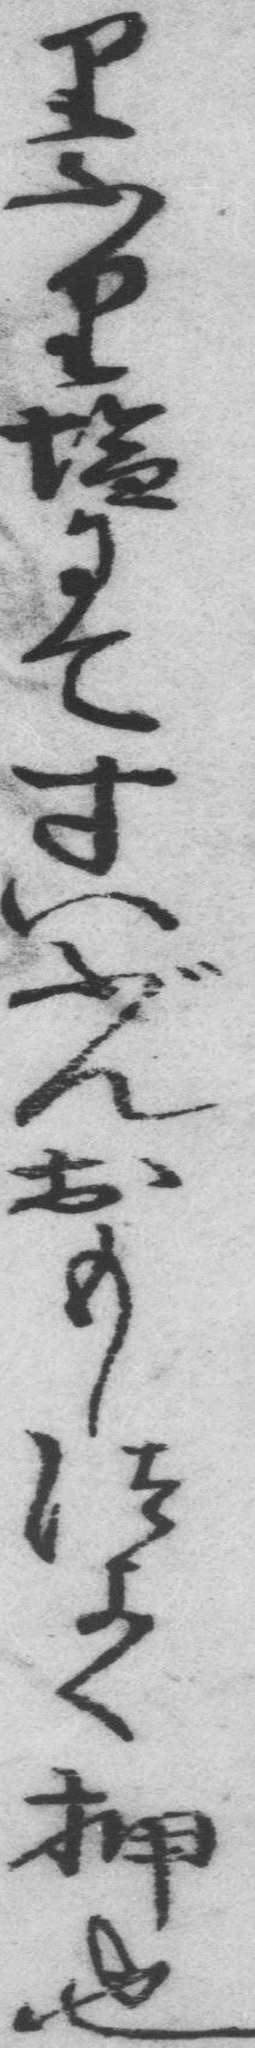りふり塩にてすいぶんおもしつよく押也
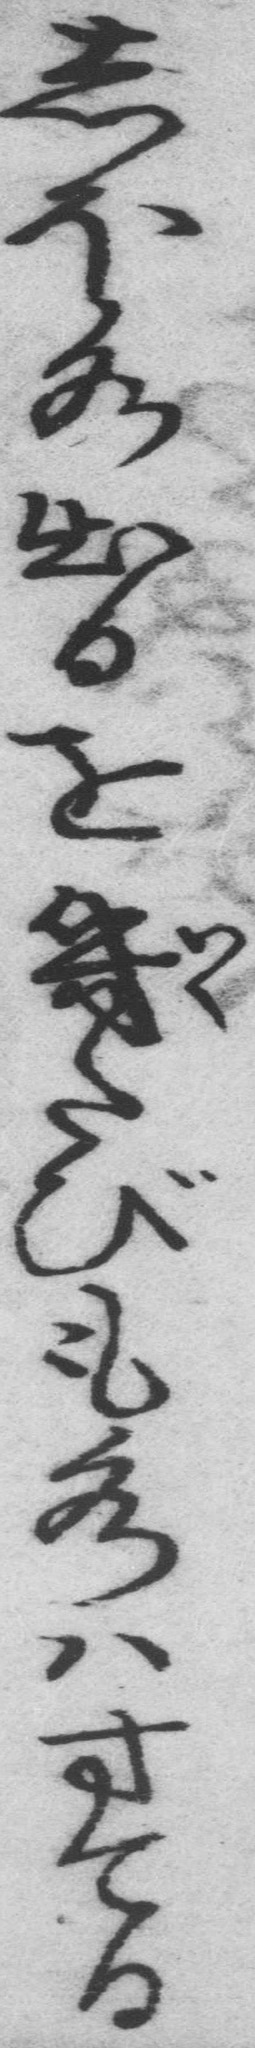しほ水出るを幾たびも水はすてる
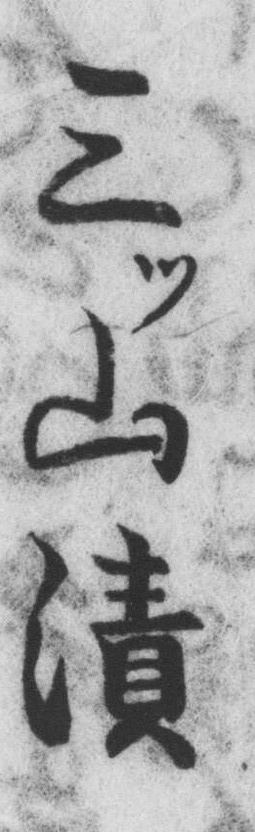三ツ山漬
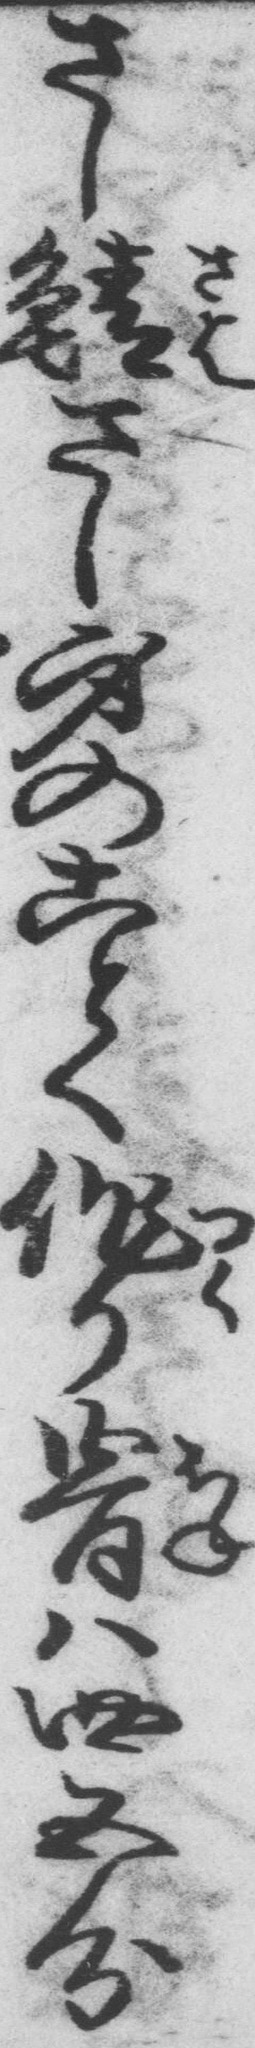さし鯖さし身のことく作り骨は四五分
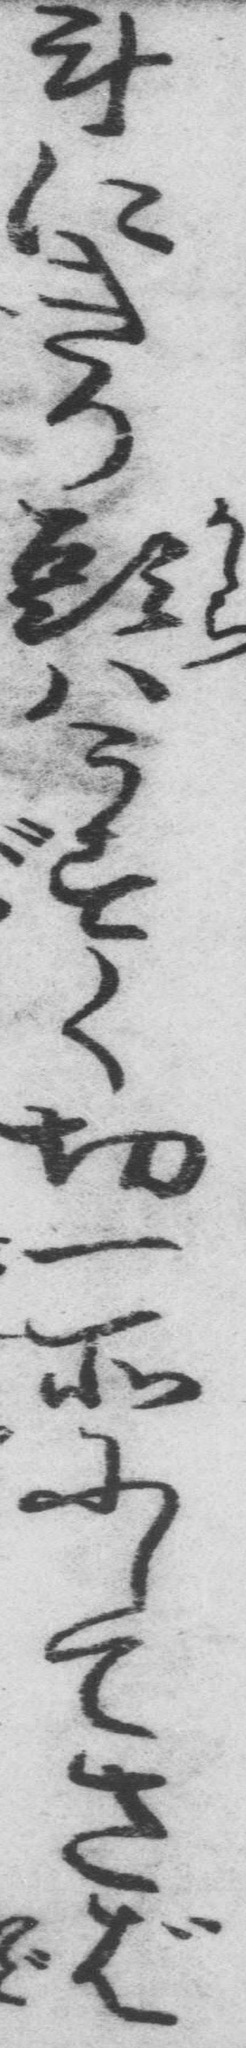斗にきり頭はうすく切一所にしてさば
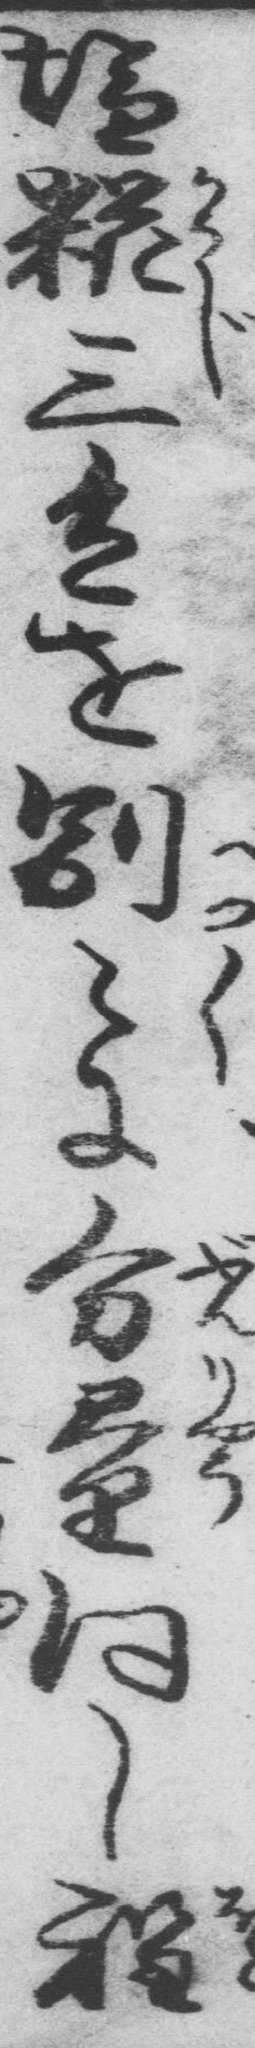塩糀三色を別々に分量同し程
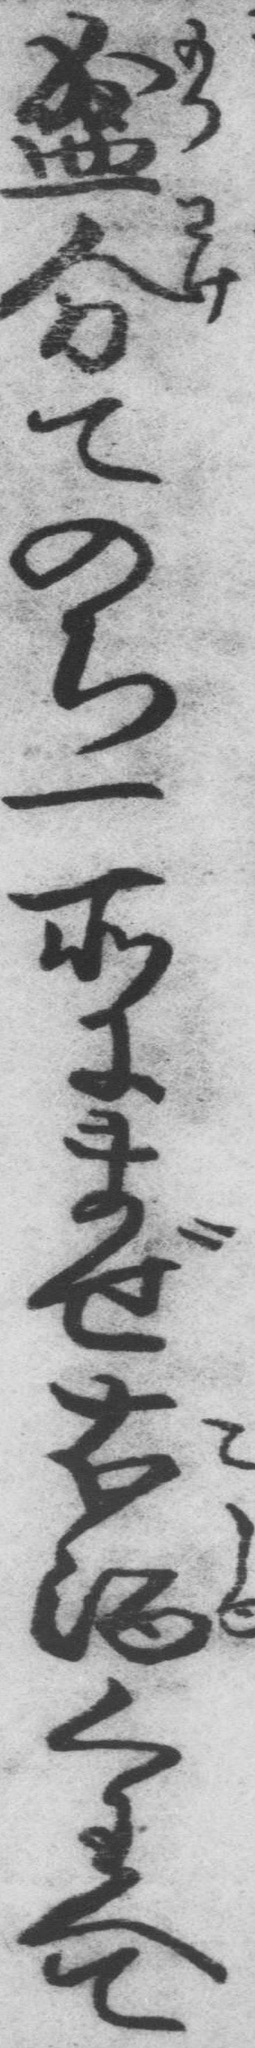盛分てのち一所にまぜ古酒くわへて
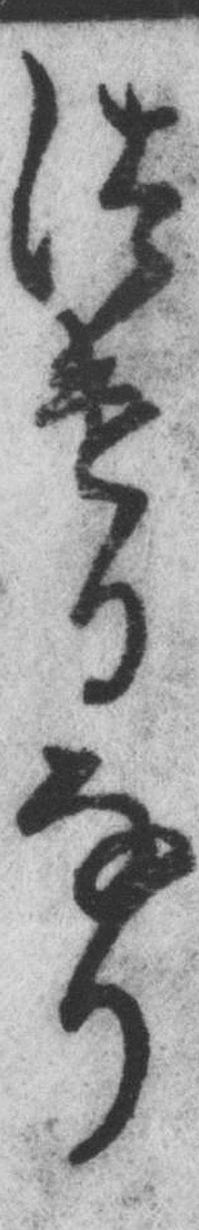つけるなり
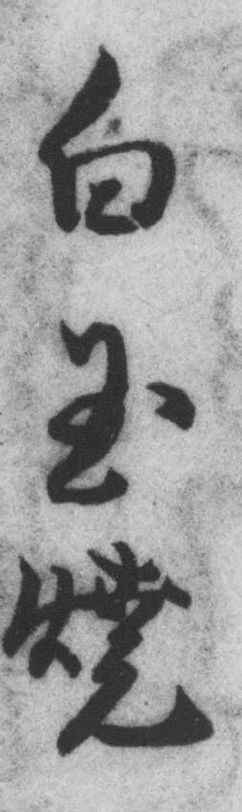白玉焼

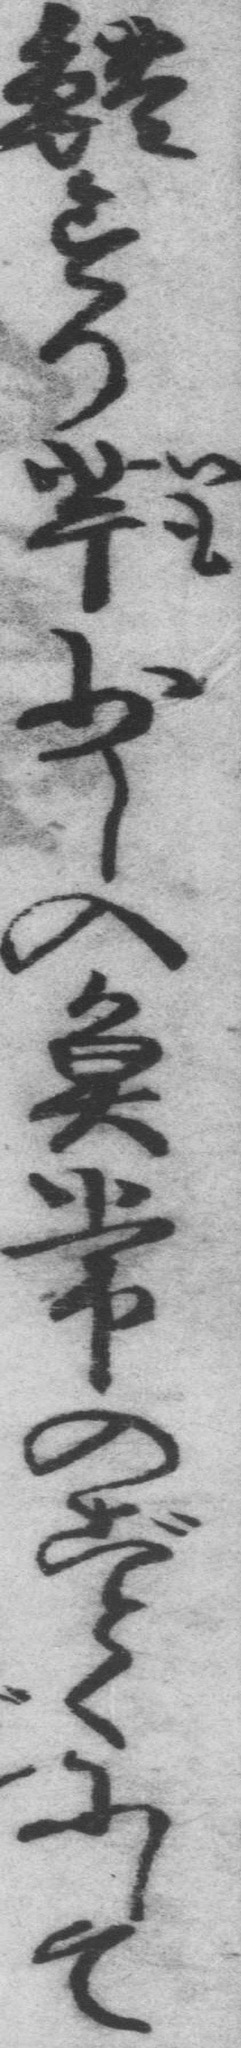鱧すり芋少し入魚常のごとくにして
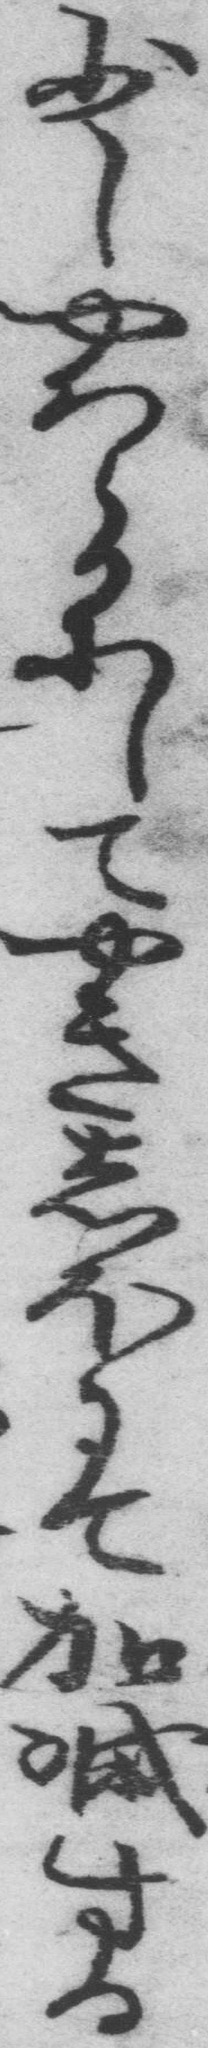少しやはらかにしてやきしほにて加減する
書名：料理山海郷
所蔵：大阪府立大学学術情報センター 国文学研究資料館
